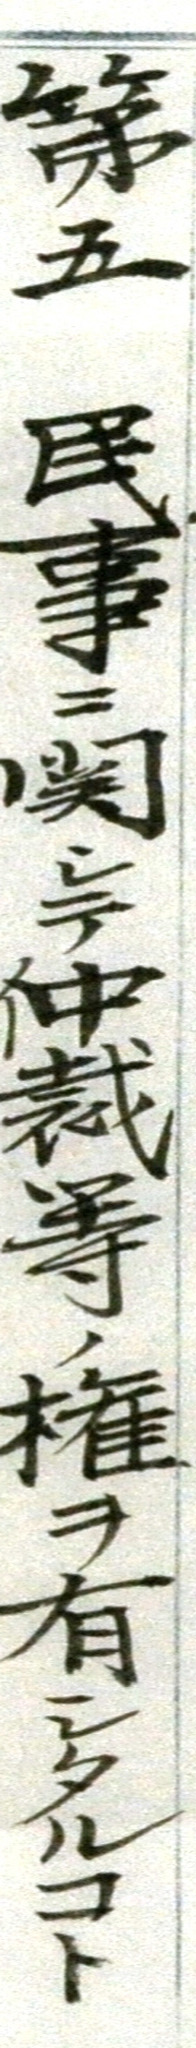第五民事ニ関シテ仲裁等ノ権ヲ有シタルコト
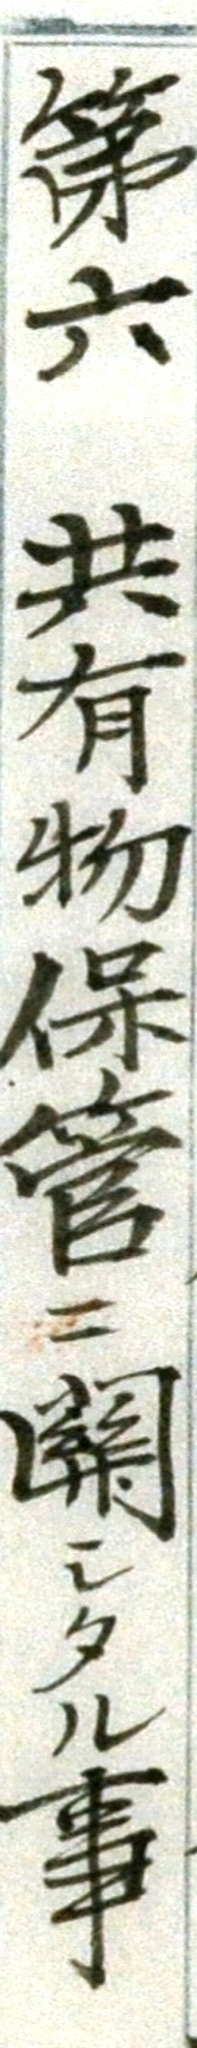第六共有物保管ニ関シタル事
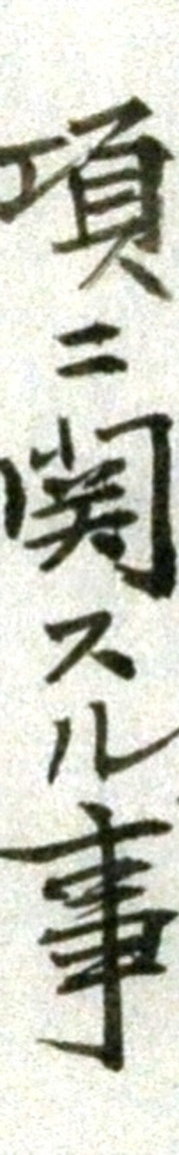項ニ関スル事
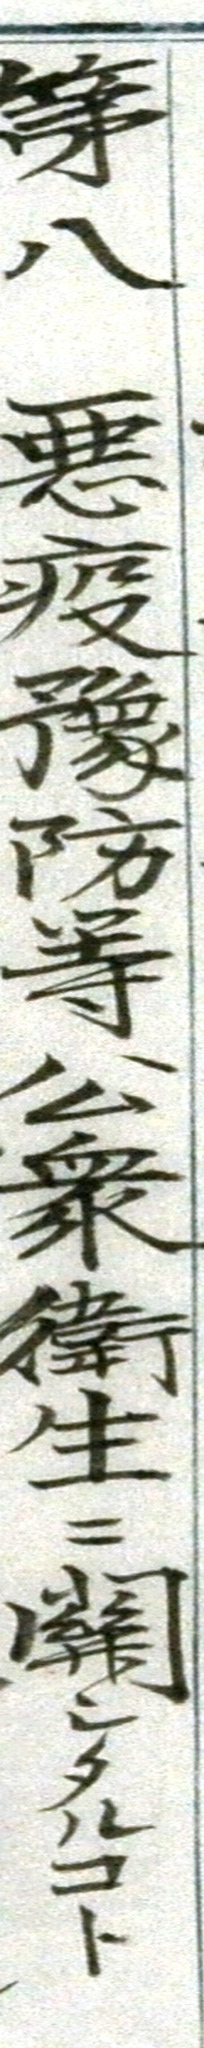第八悪疫予防等公衆衛生ニ関シタルコト
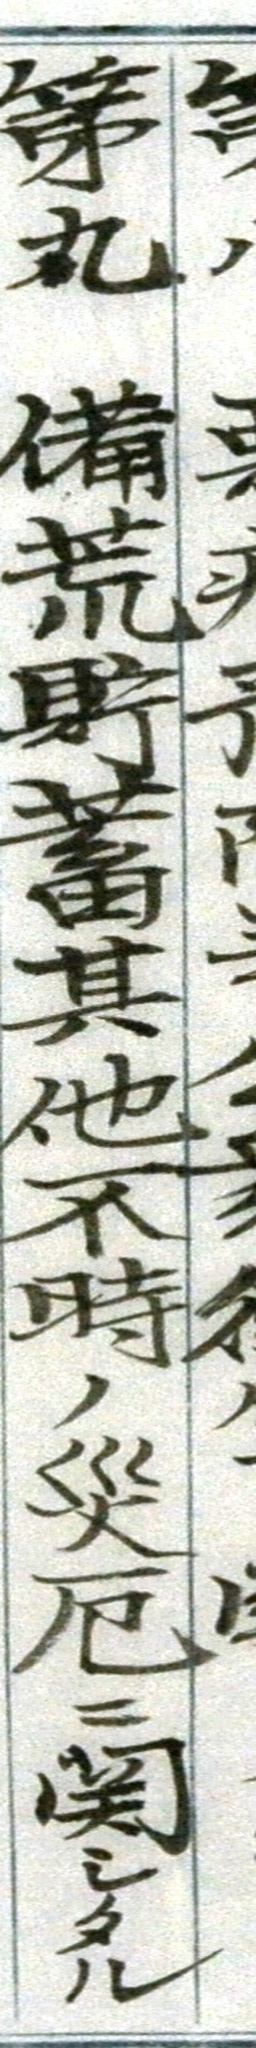第九備荒貯蓄其他不時ノ災厄ニ関シタル
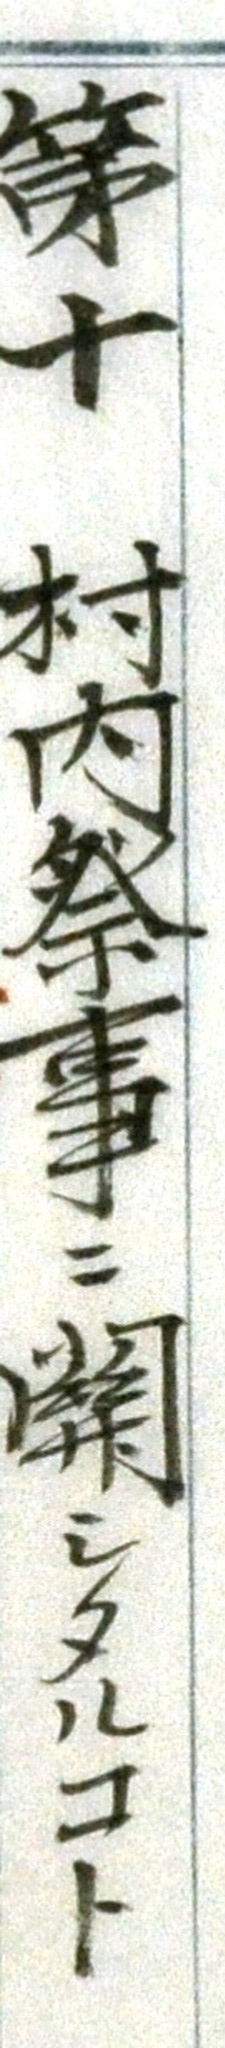第十村内祭事ニ関シタルコト
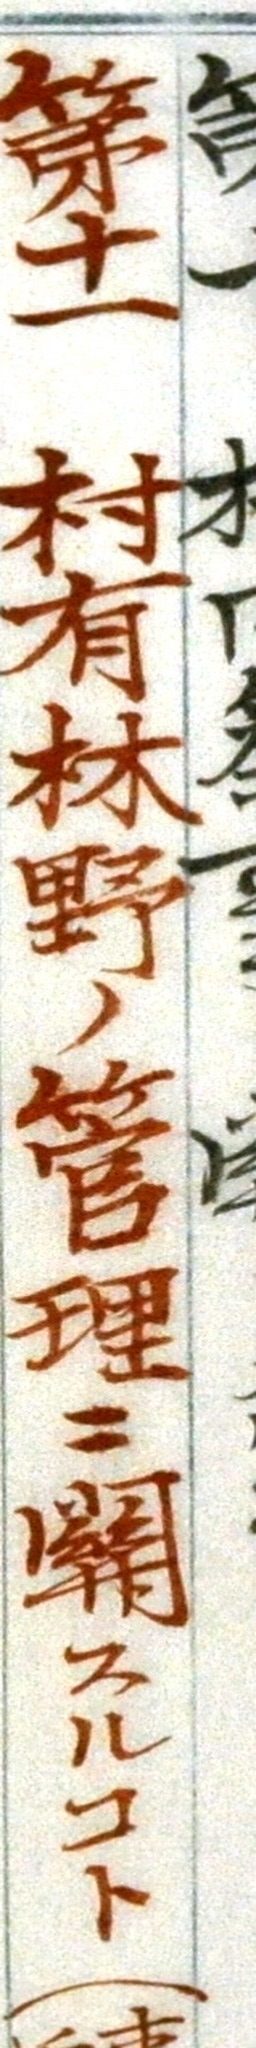第十一村有林野ノ管理ニ関スルコト

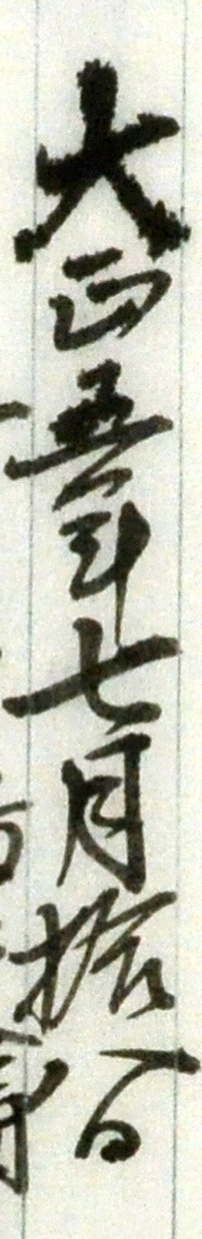大正五年七月拾八日
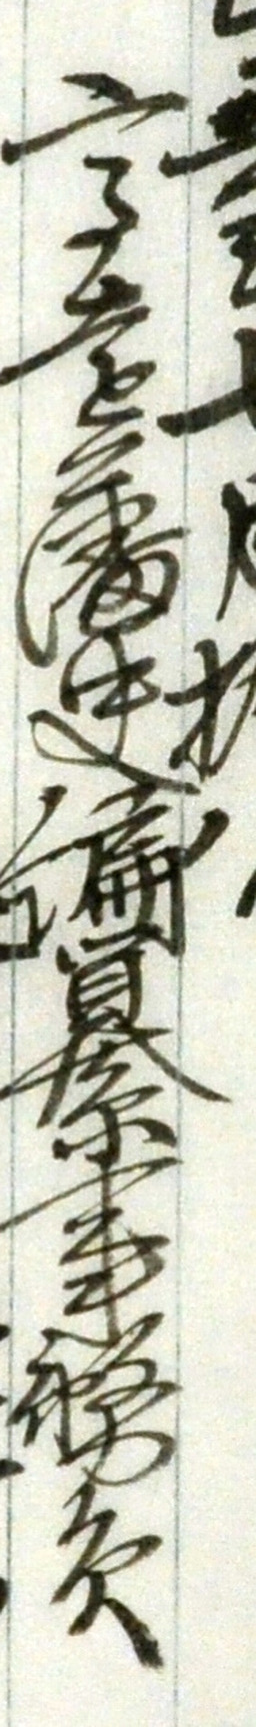高遠藩史編纂事務員
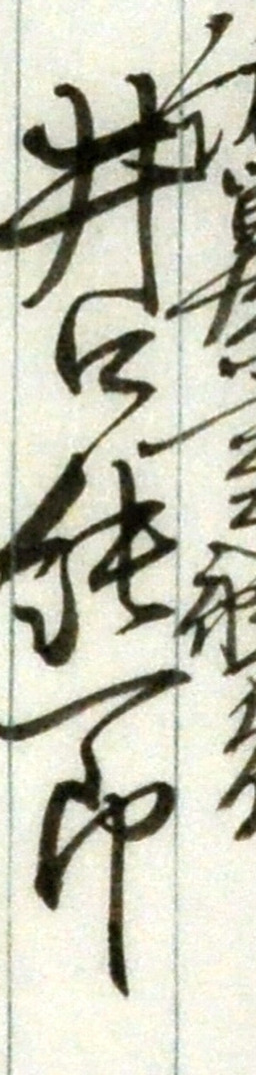井口純一郎
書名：村役人職掌大略
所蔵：伊那市立高遠町図書館・合同会社AMANE
